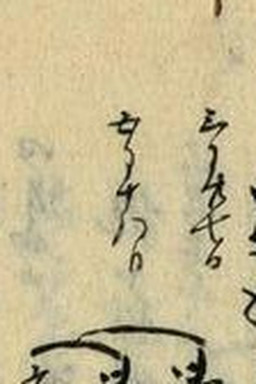五月十八日
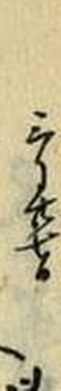三月廿七日
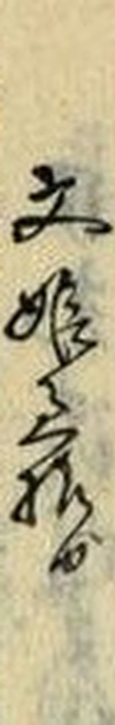文姫君様ゟ
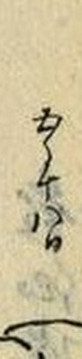五月十八日
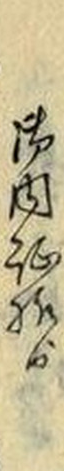御内証様ゟ
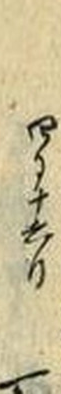四月十六日
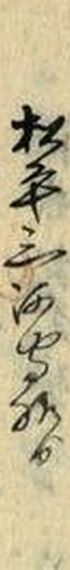松平三河守様ゟ
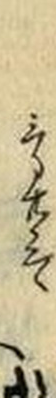三月廿三日
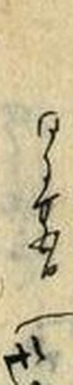四月廿五日
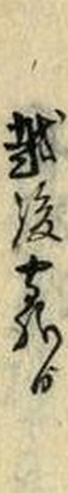越後守様ゟ
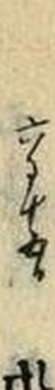六月十五日
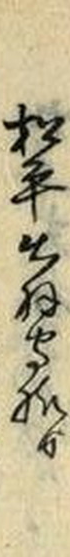松平出羽守様ゟ
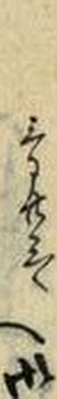三月廿三日
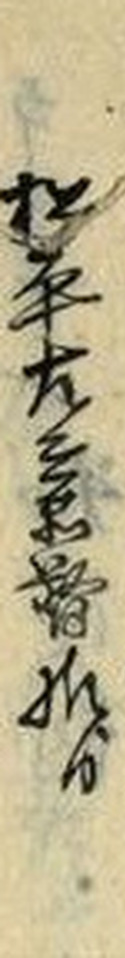松平左兵衛督様ゟ
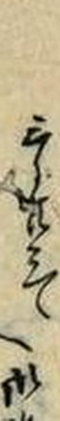三月廿三日

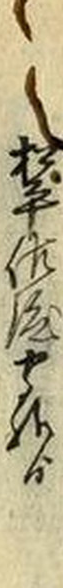松平佐渡守様ゟ
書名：少傅日録抄（斉承付側向頭取日記、在府）
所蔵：福井県文書館 Fukui Prefectural Archives
